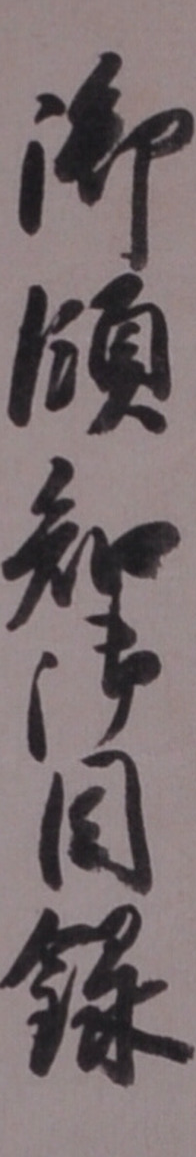御領知御目録
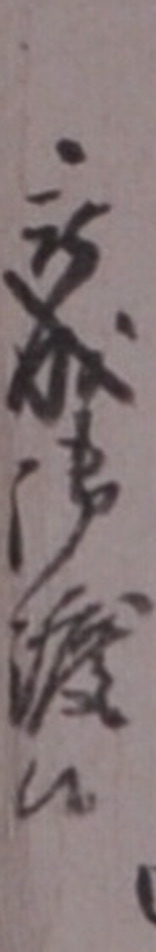被成御渡候
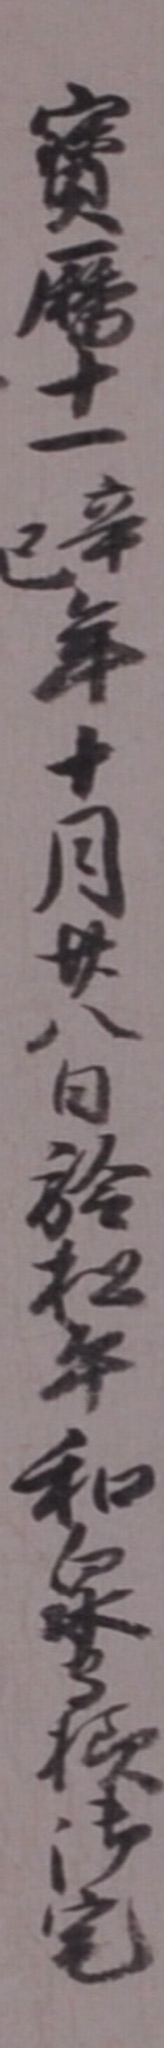宝暦十一辛巳年十月廿八日於松平和泉守様御宅

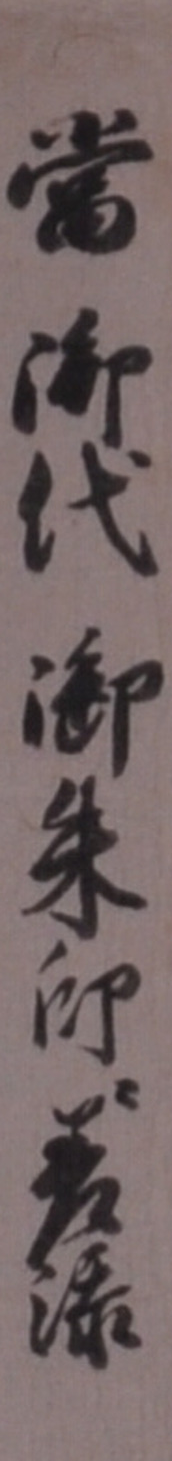当御代御朱印ニ差添
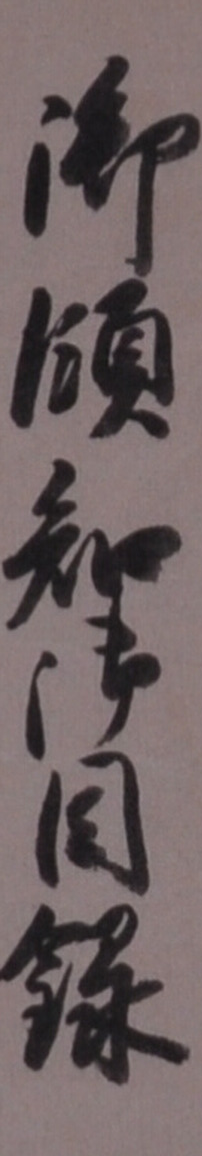御領知御目録
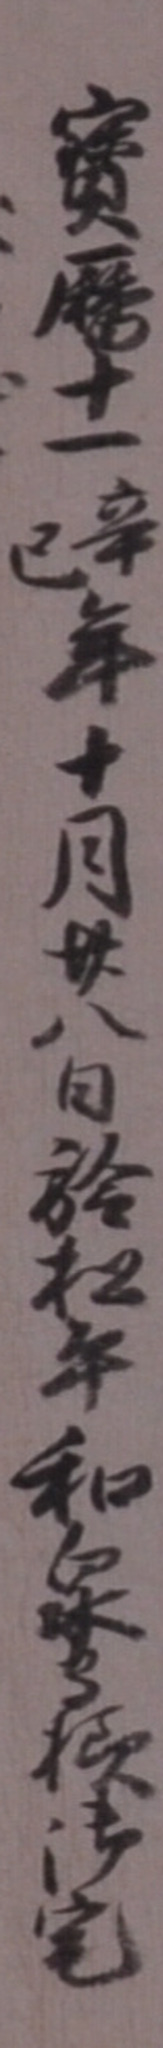宝暦十一辛巳年十月廿八日於松平和泉守様御宅
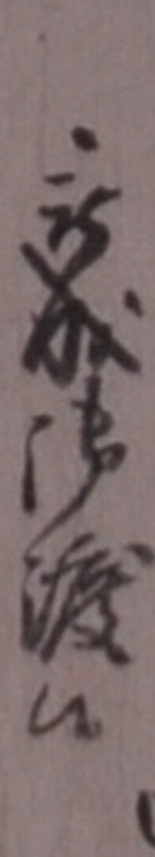被成御渡候
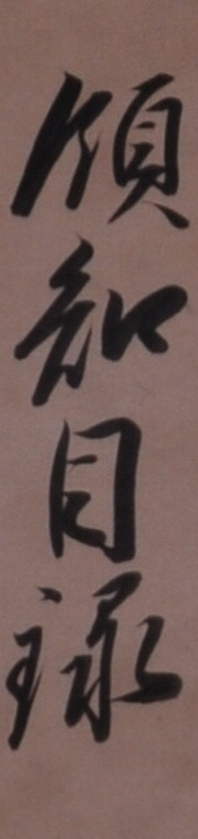領知目録
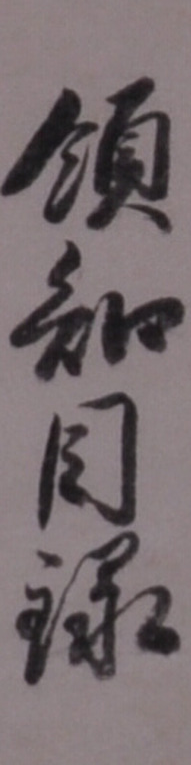領知目録

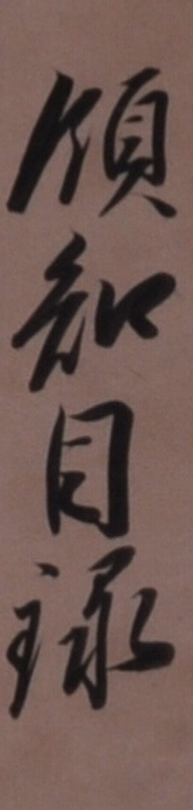領知目録
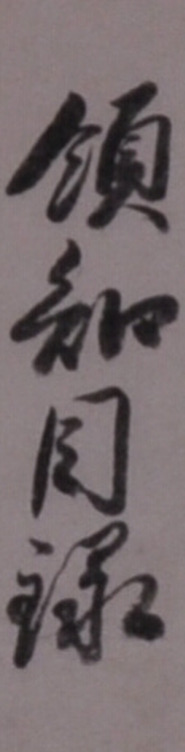領知目録

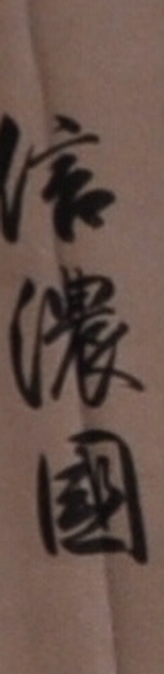信濃国
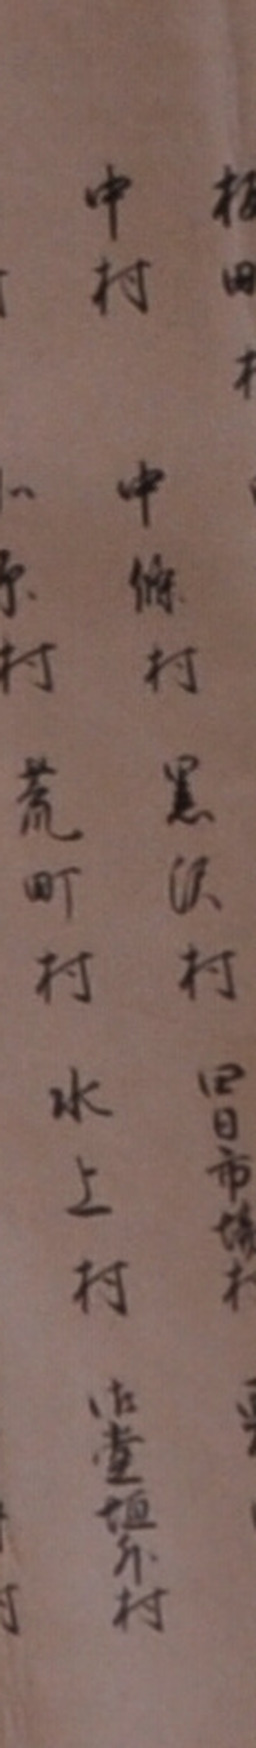台村北原村荒町村水上村御堂垣外村
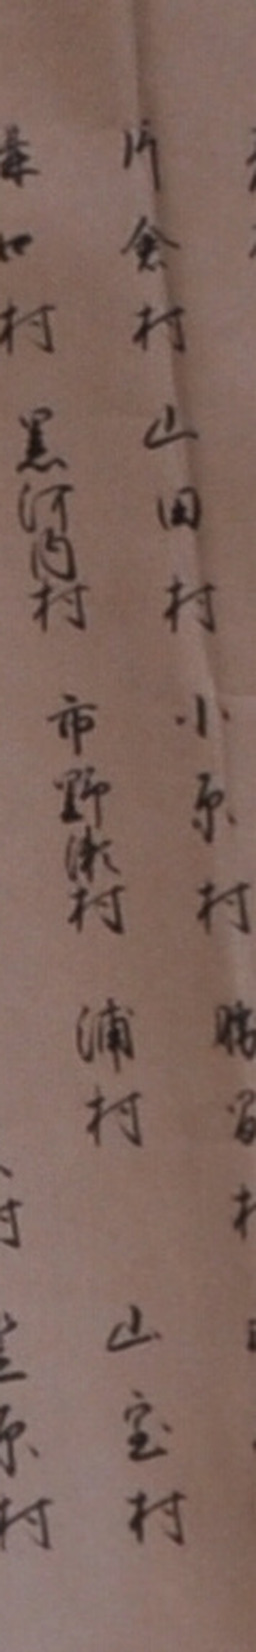溝口村黒河内村市野瀬村浦村山室村
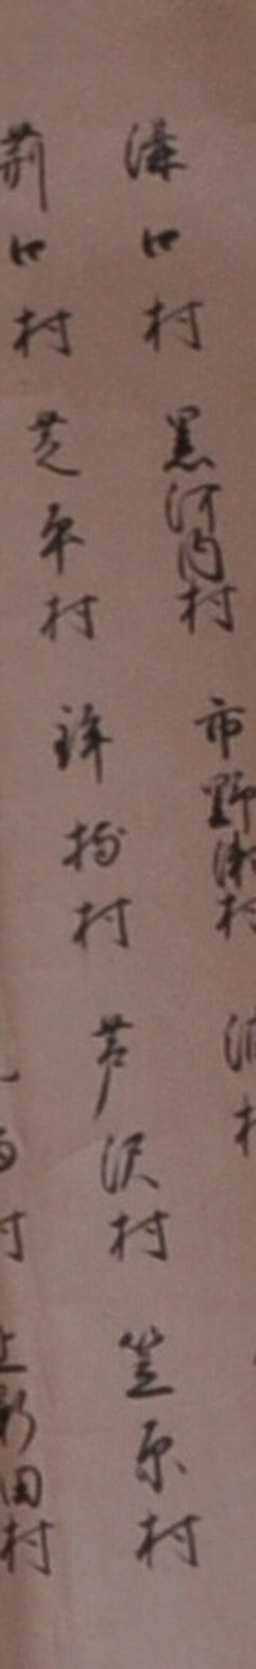荊口村芝平村鉾持村芦沢村笠原村
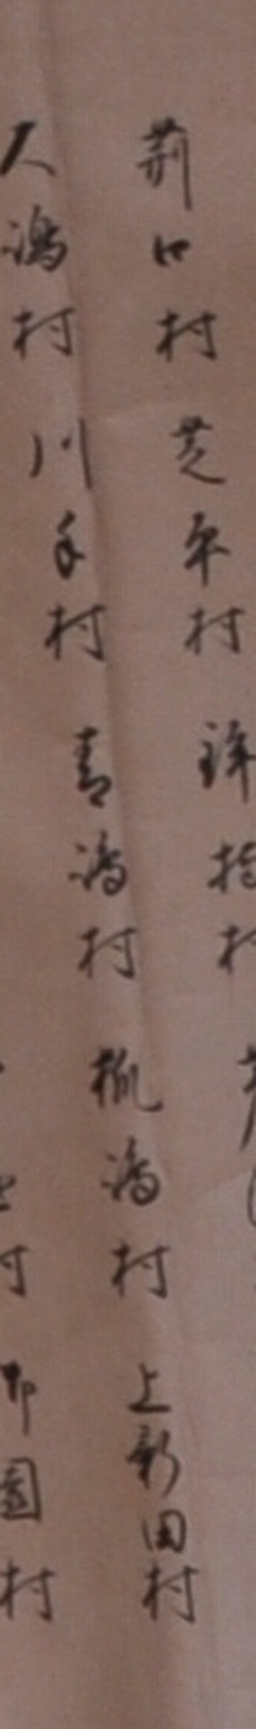大島村川手村青島村狐島村上新田村
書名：御朱印写・領地目録
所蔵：伊那市立高遠町図書館・合同会社AMANE
